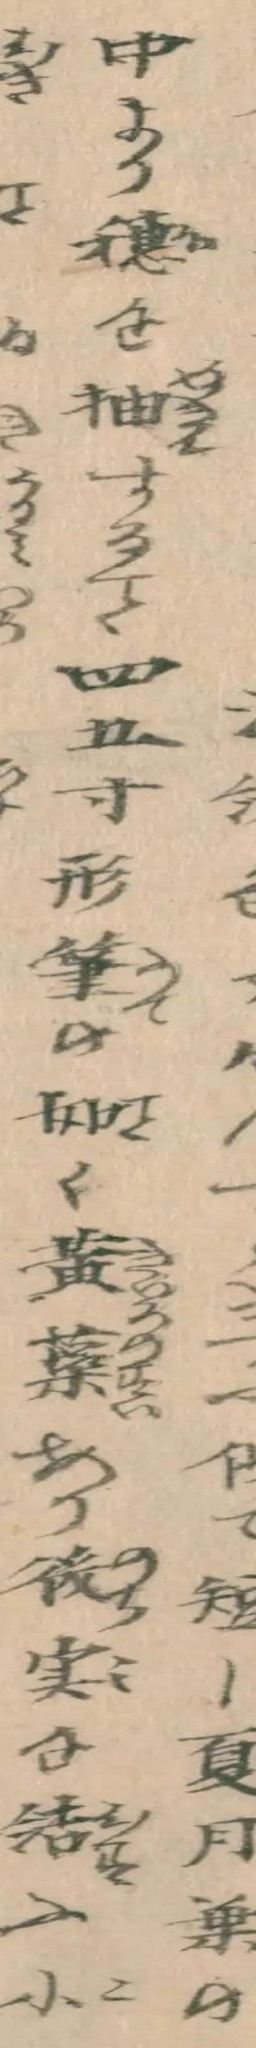中より穂を抽すること四五寸形筆の如く黄蕊あり後実を結ふ小
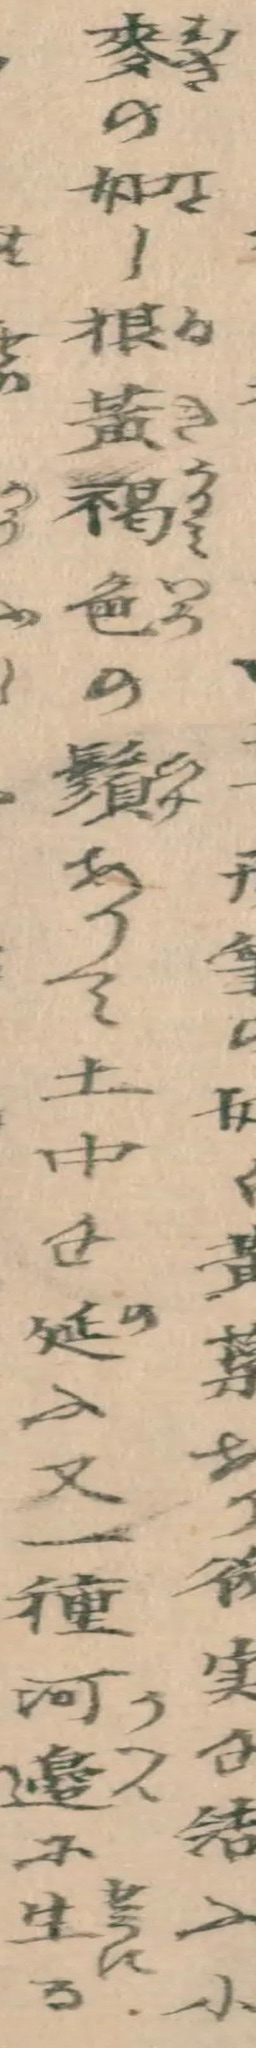麦の如し根黄褐色の鬚ありて土中を延ふ又一種河辺に生る
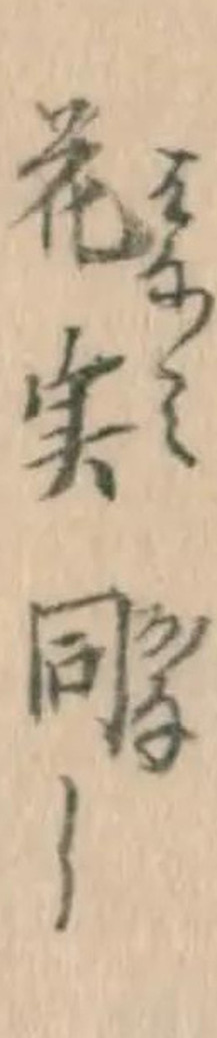花実同し

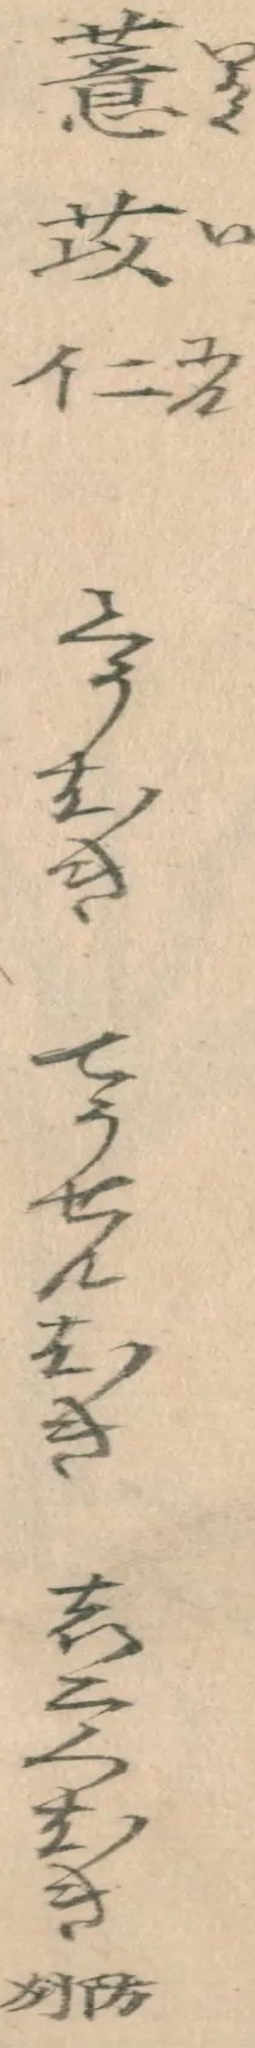薏苡仁とうむきてうせんむきしこくむき防州
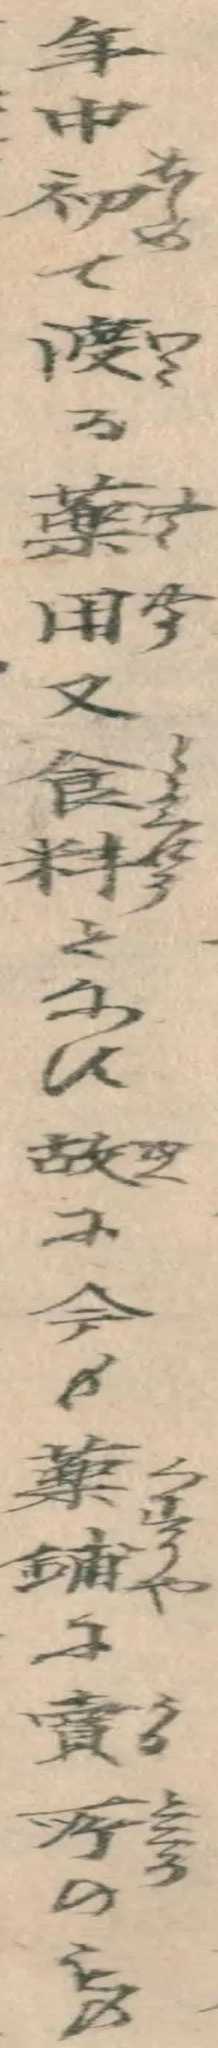年中初て渡る薬用又食料となす故に今も薬鋪に売所のもの
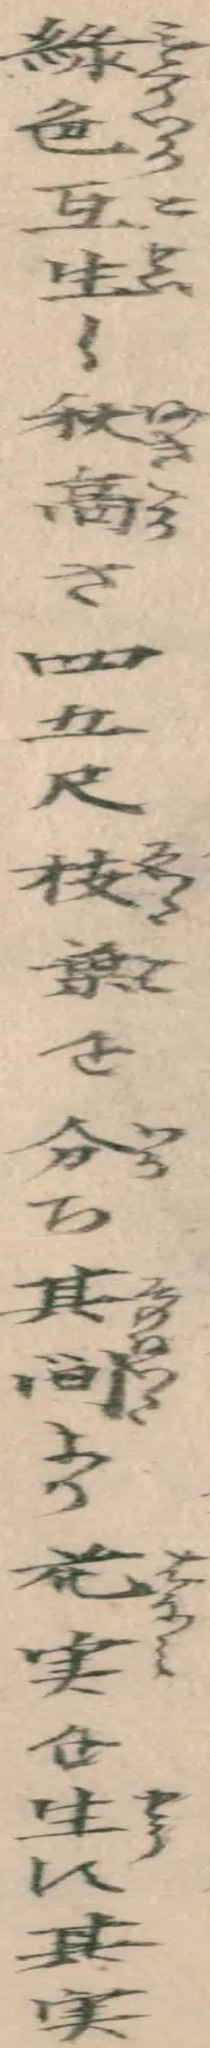緑色互生し秋高さ四五尺枝葉を分ち其間より花実を生す其実
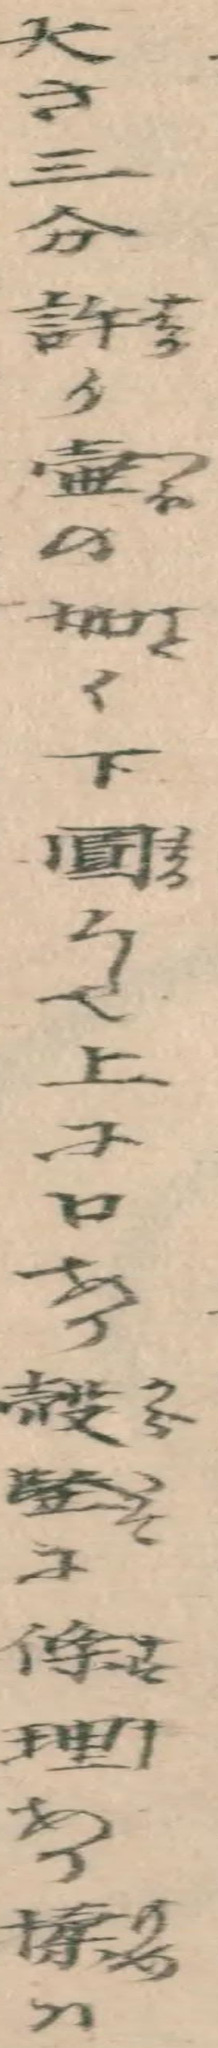大さ三分許り壺の如く下円くして上に口あり殻竪に条理あり揉は
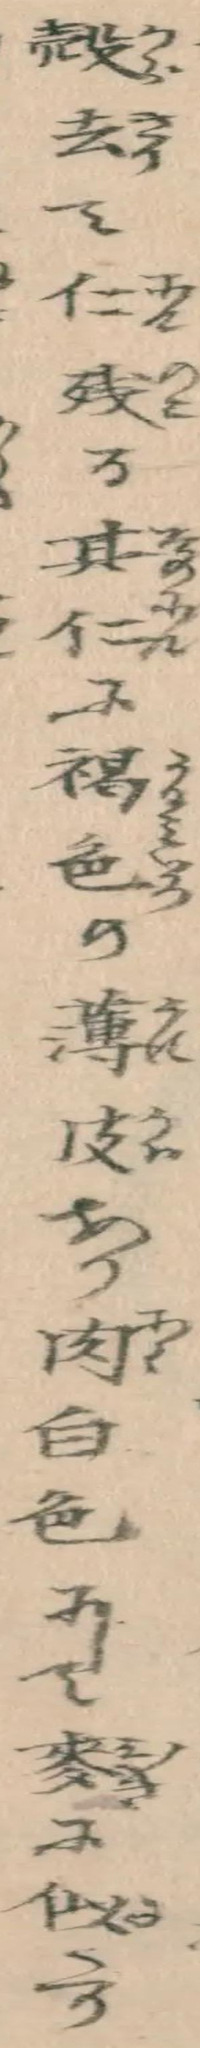殻去て仁残る其仁に褐色の薄皮あり肉白色にして麦に似たり
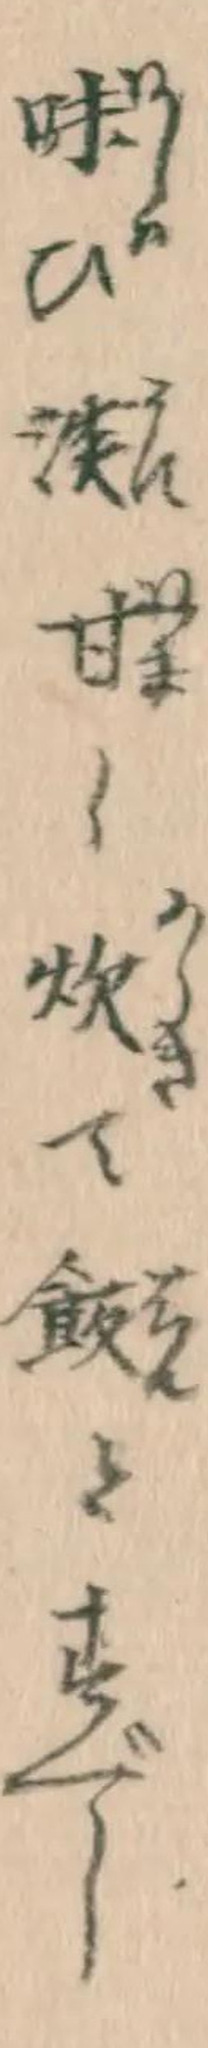味ひ淡甘し炊て飯となすべし
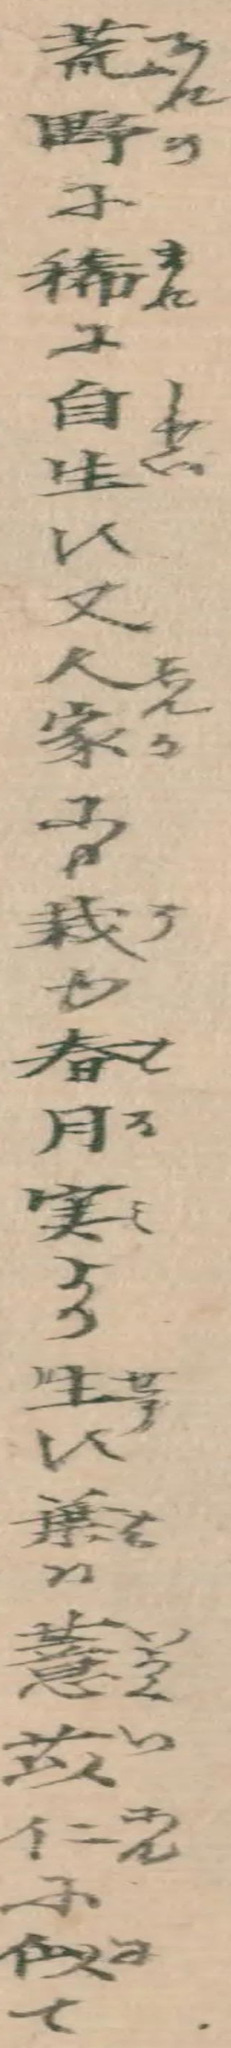荒野に稀に自生す又人家にも栽ゆ春月実より生す葉は薏苡仁に似て
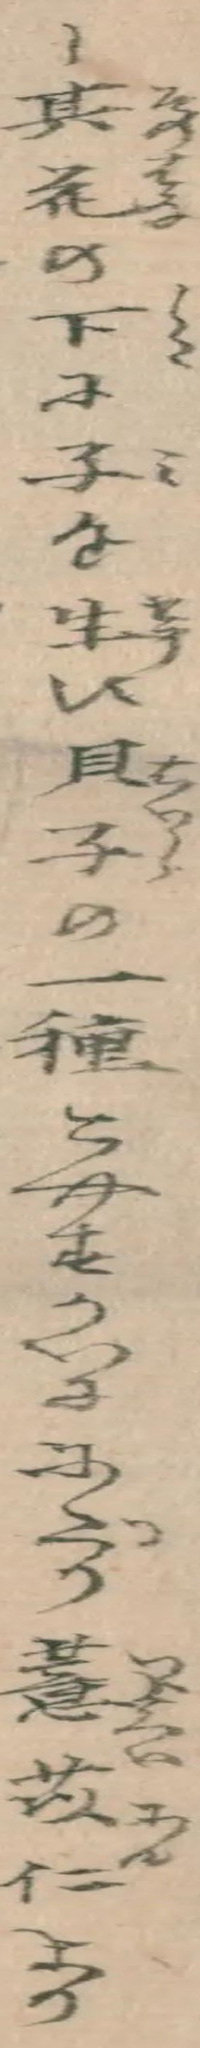し其花の下に子を生す貝子の一種こやすかいににたり薏苡仁より
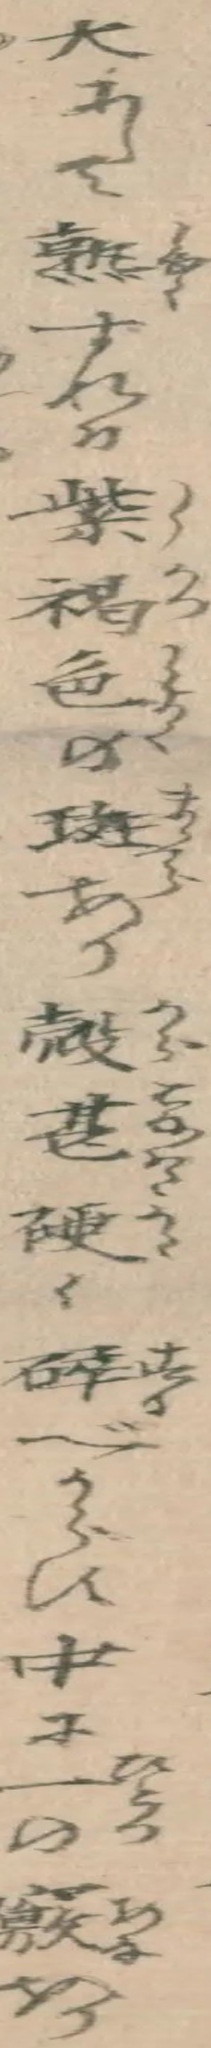大にして熟すれは紫褐色の斑あり殻甚硬く砕べからす中に一の竅あり
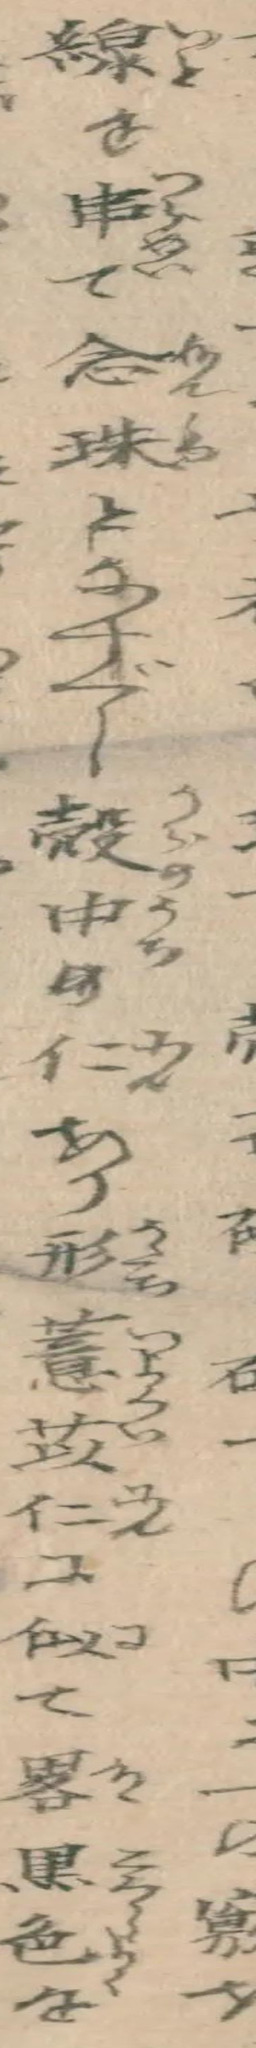線を串て念珠となすべし殻中仁あり形薏苡仁に似て略黒色を

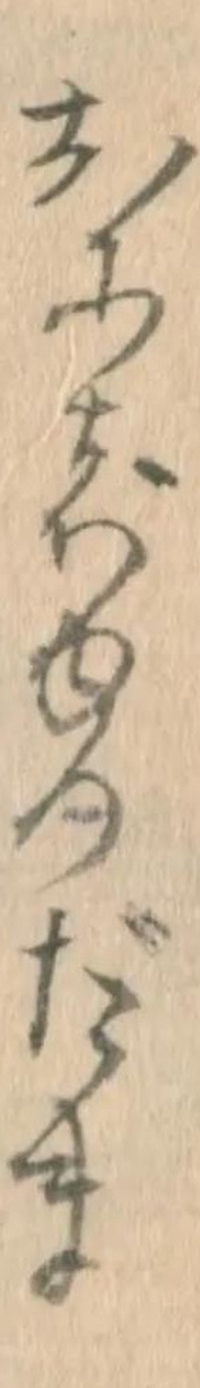おにじゆつだま
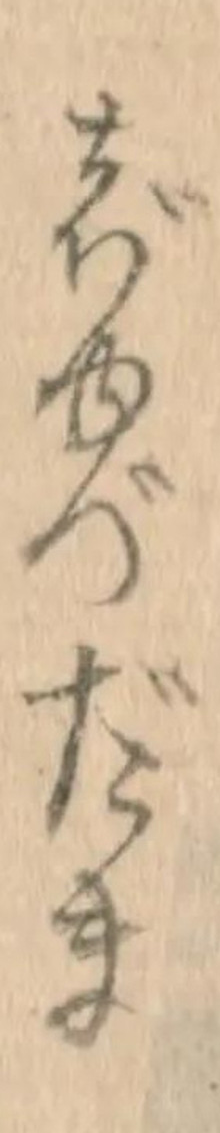じゆづだま

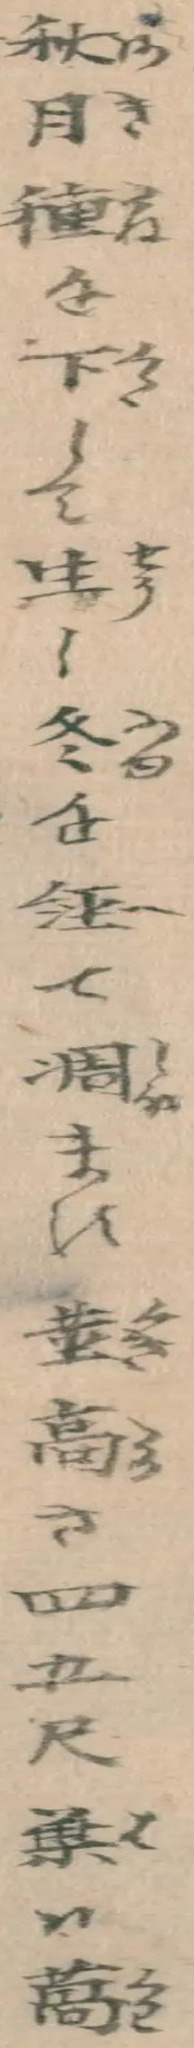秋月種を下して生し冬を経て凋ます茎高さ四五尺葉は萵
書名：本草図譜. 巻40-42
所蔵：国立国会図書館 National Diet Library, JAPAN
